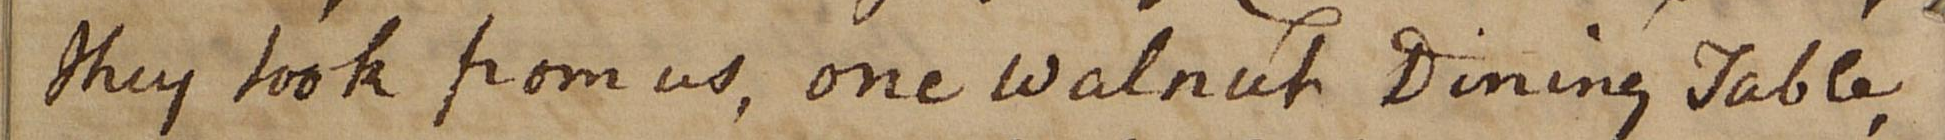they took from us, one Walnut Dining Table,
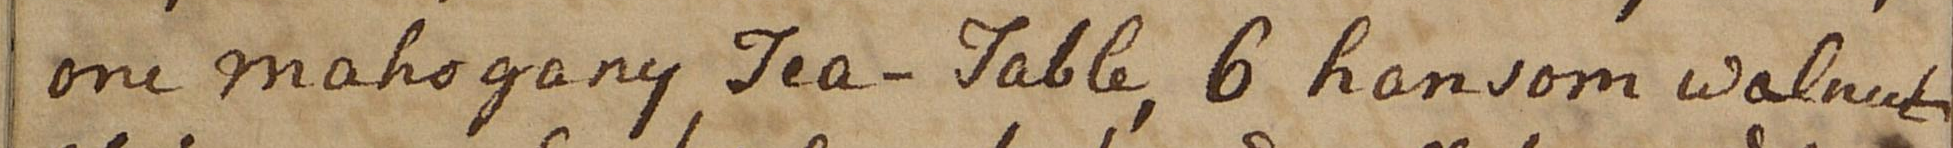one mahogany Tea- Table, 6 hansom Walnut
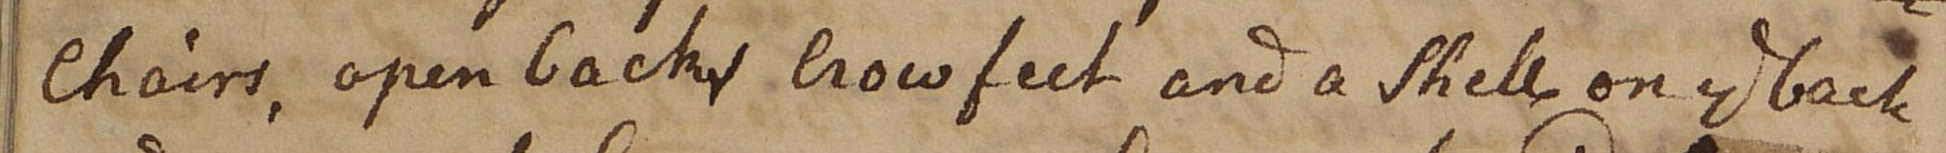Chairs, open backs Crow feet and a Shell on y^e back
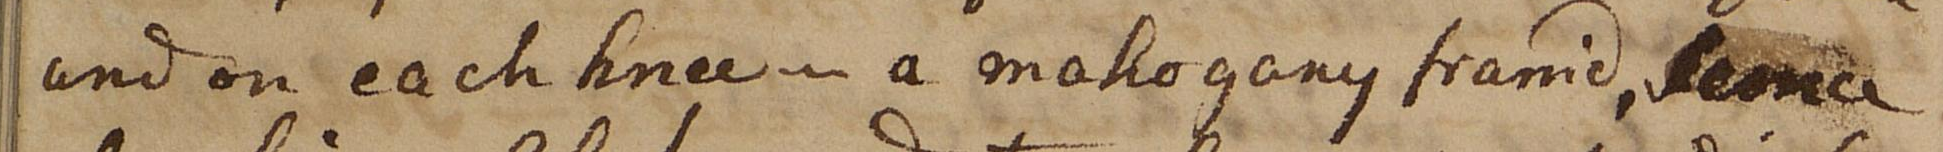and on each knee- a mahogany fram'd, sconce
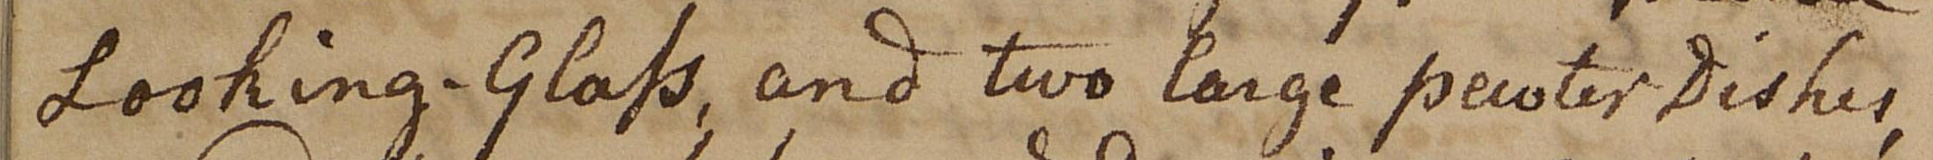Looking-Glass, and two large pewter Dishes,
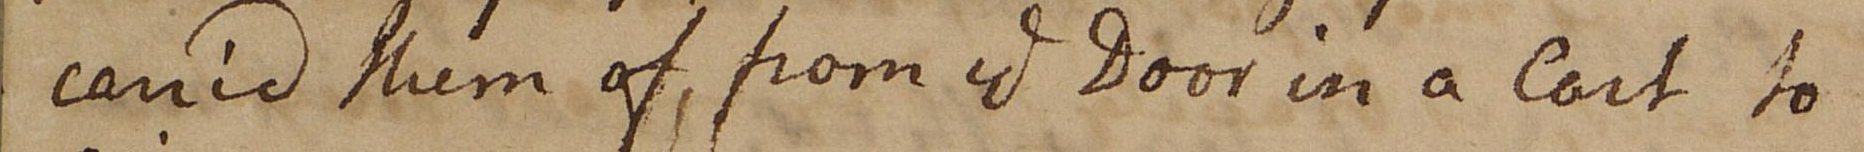carrid them of from y^e Door in a Cart to
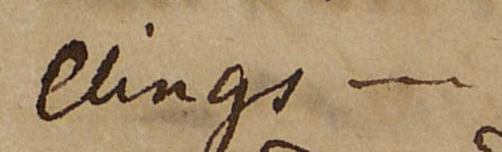Clings-
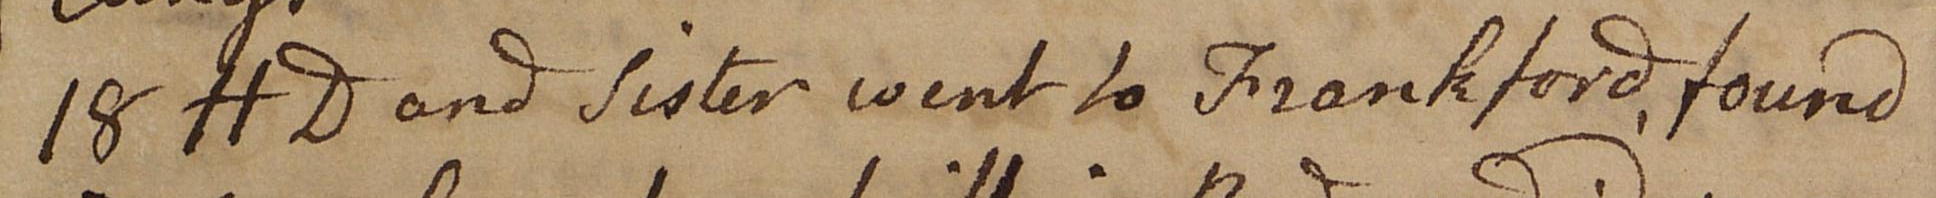18 HD and sister went to Frankford, found
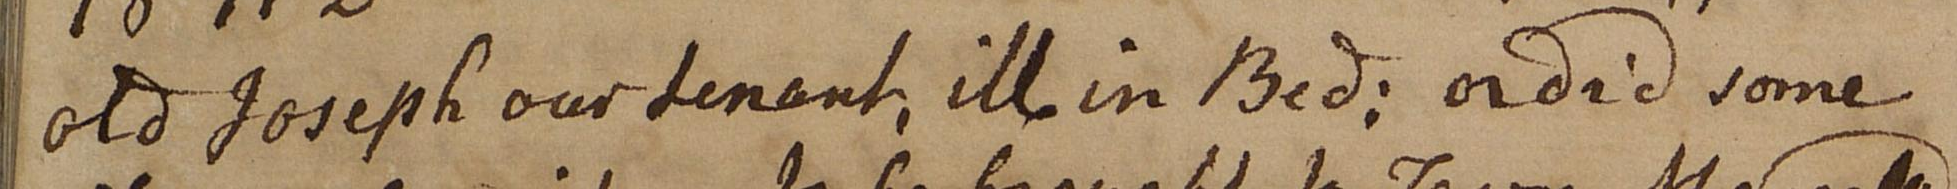old Joseph our tenant, ill in Bed; ordr'd some
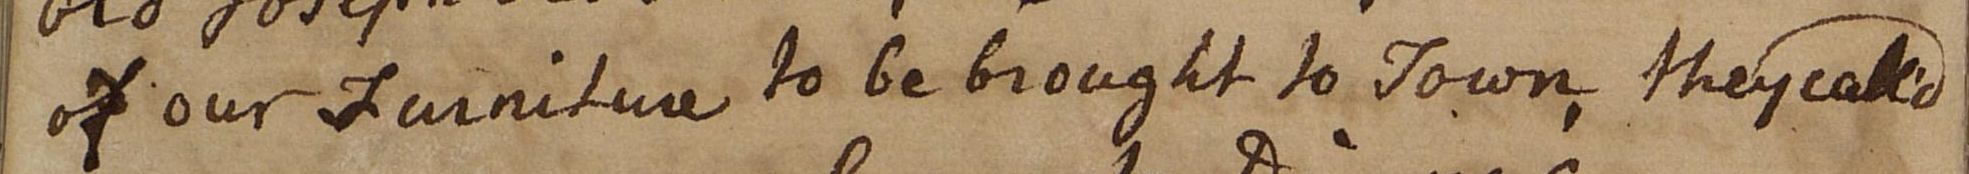of our Furniture to be brought to Town, they call'd
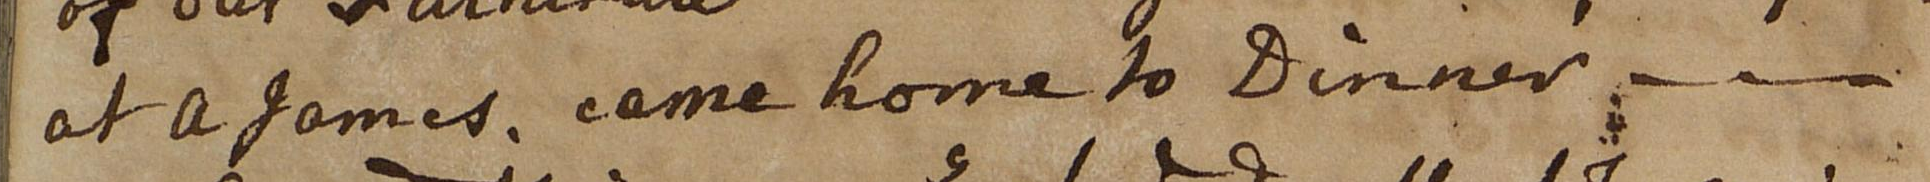at a James, came home to Dinner-
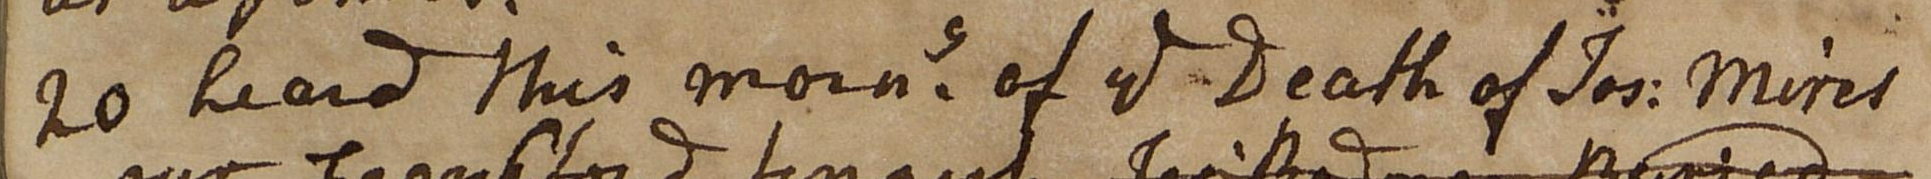20 heard this morn^g. of y^e Death of Jos: Mires
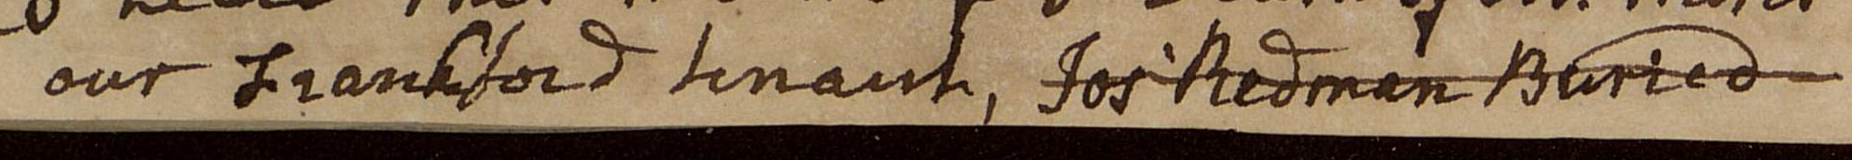our Frankford tenant, Jos' Redman Buried
